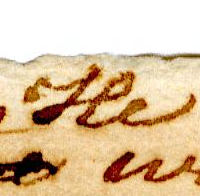He
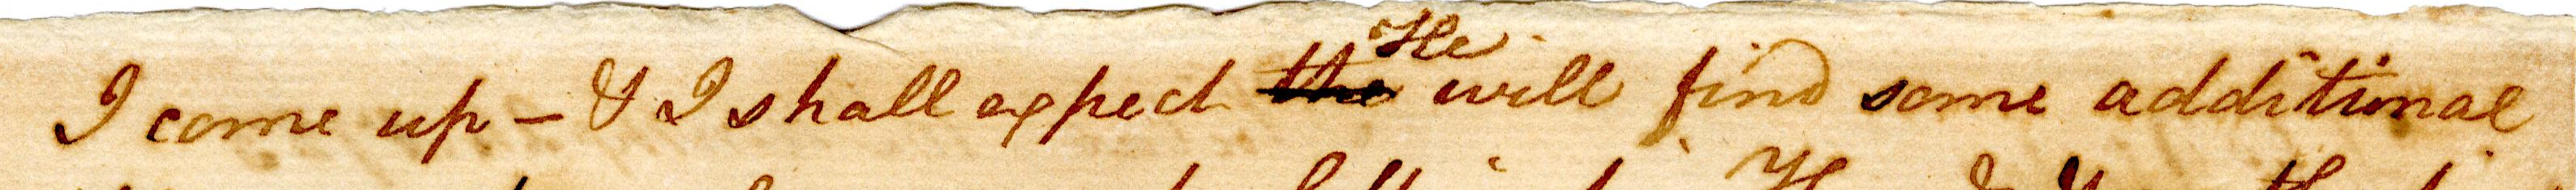I come up- & I shall expect [the] will find some additional
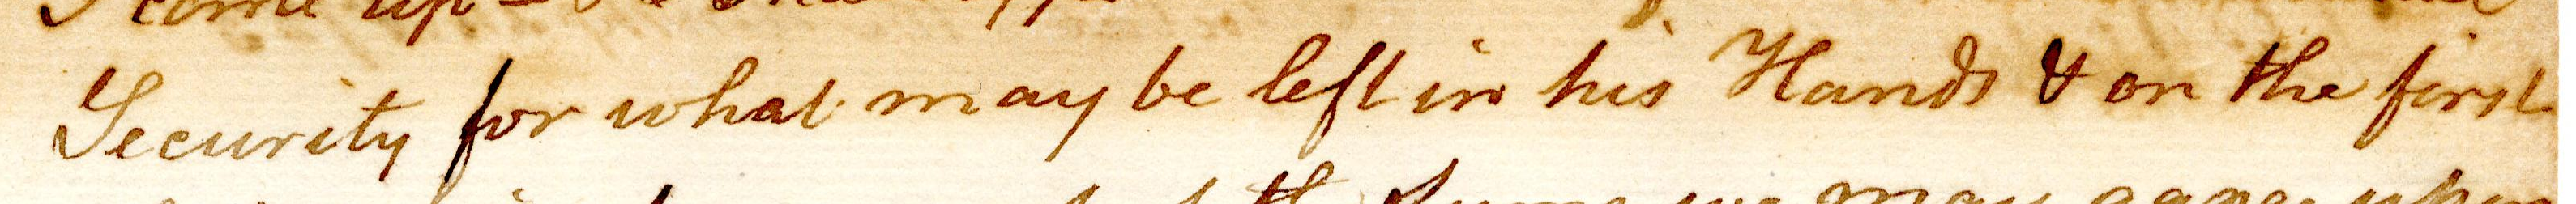Security for what may be left in his Hands & on the first
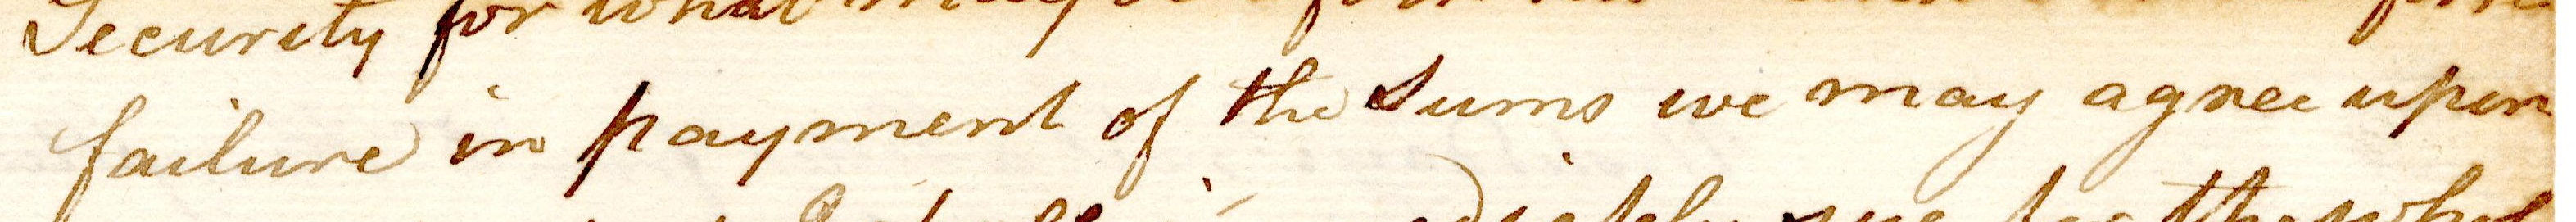failure in payment of the sums we may agree upon
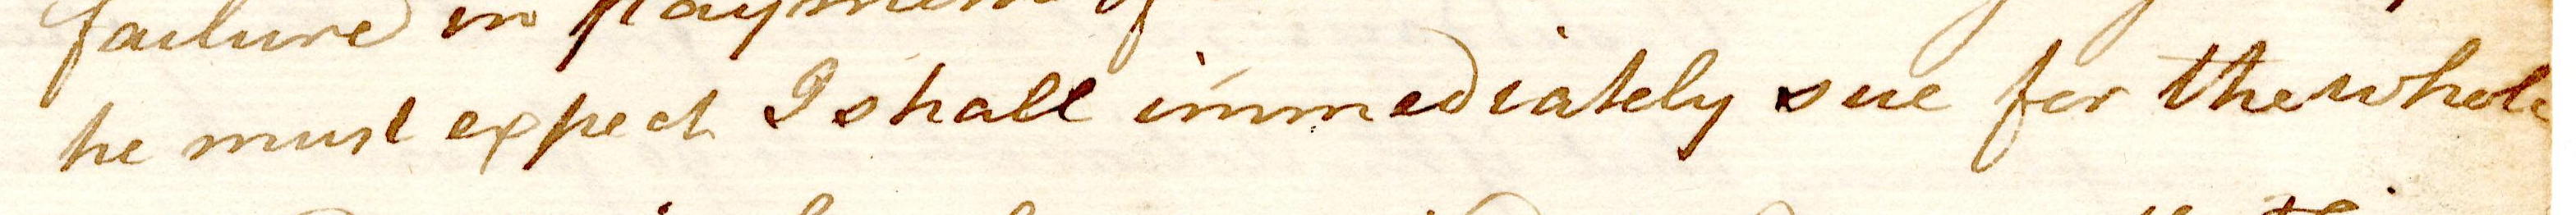he must expect I shall immediately sue for the whole
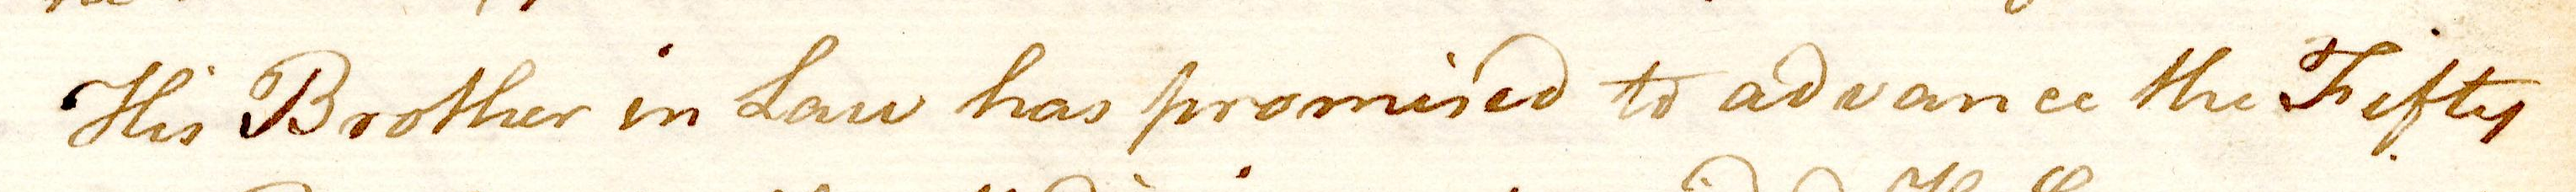His Brother in Law has promised to advance the Fifty
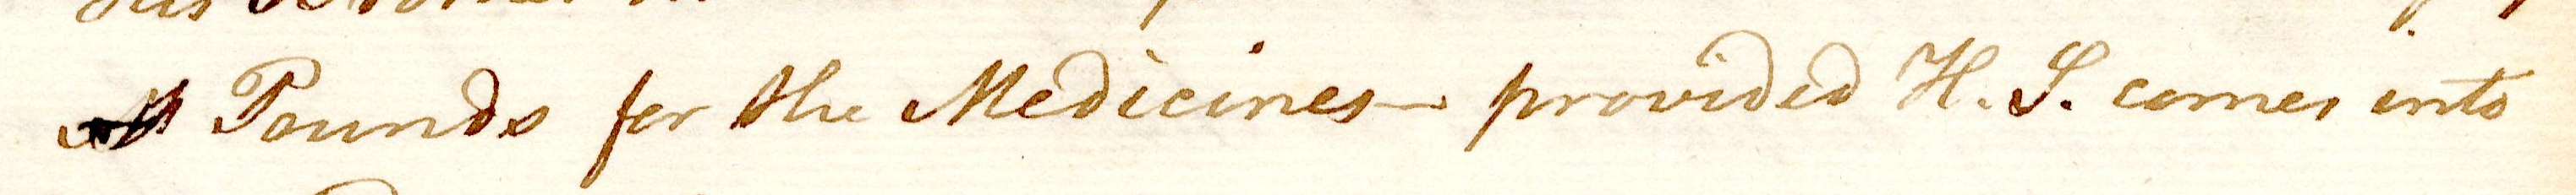[___] Pounds for the Medicines provided H.S. comes into
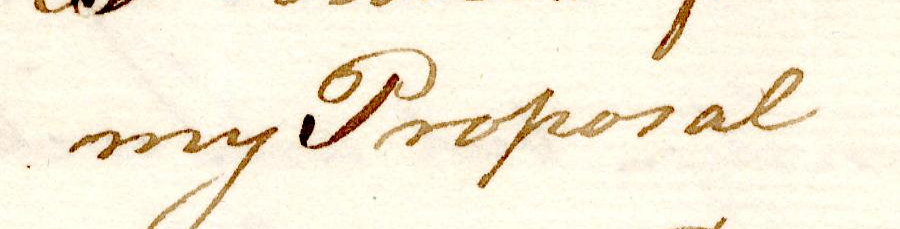my Proposal
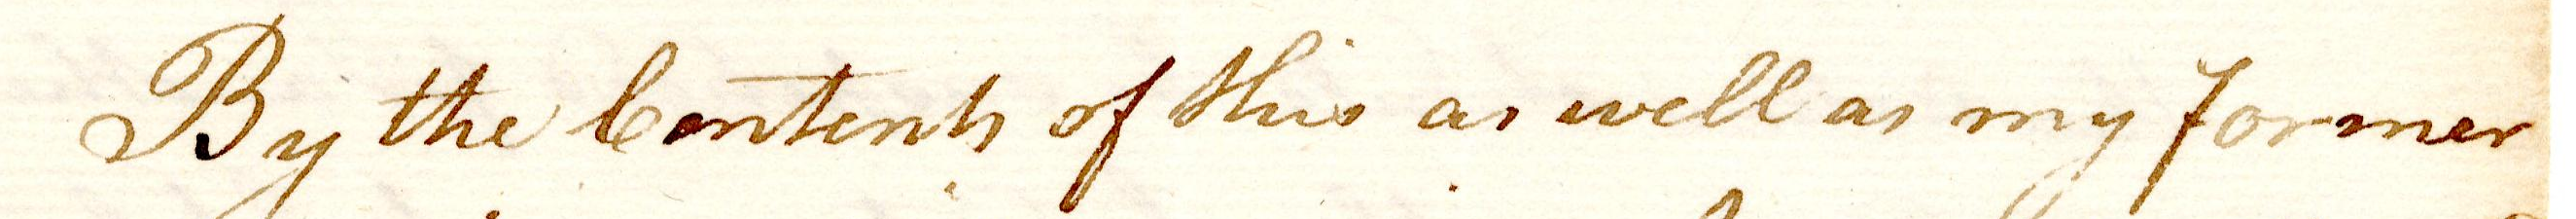By the Contents of this as well as my former
